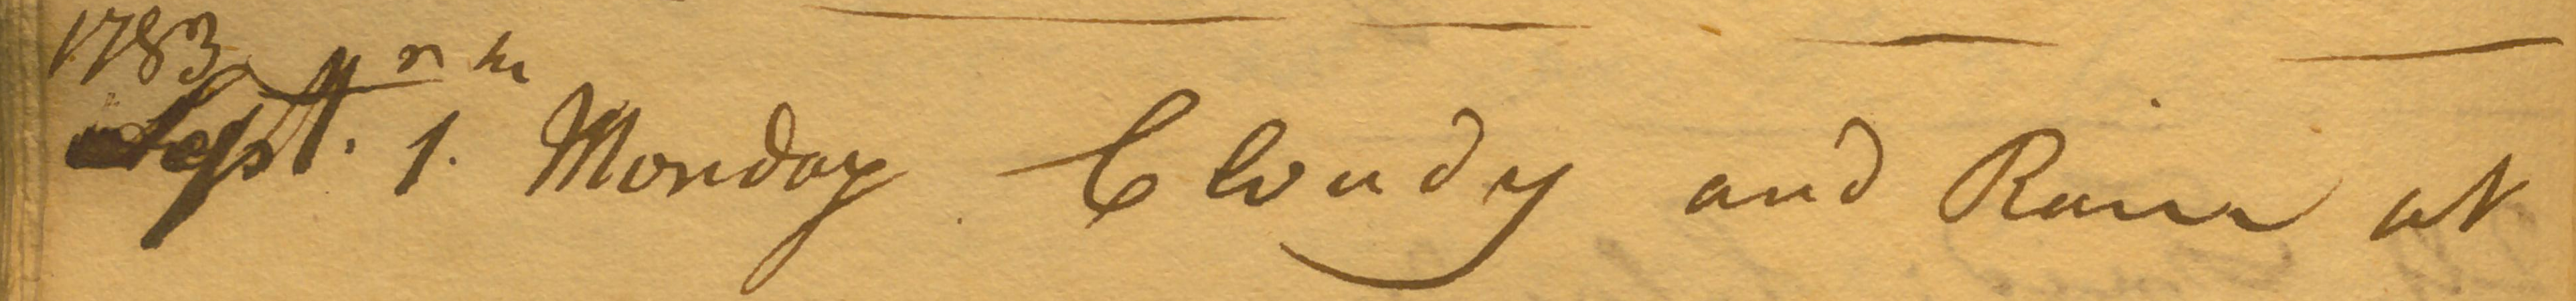Sept^r. 1^th. Monday Cloudy and Rain at
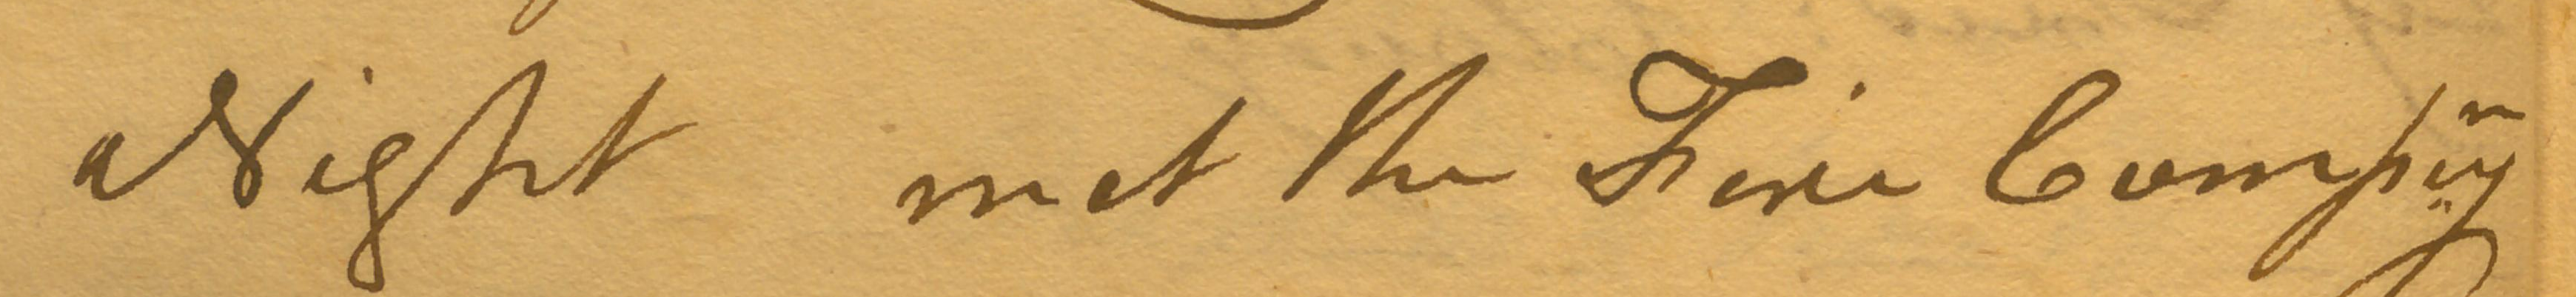Night met the Fire Compey
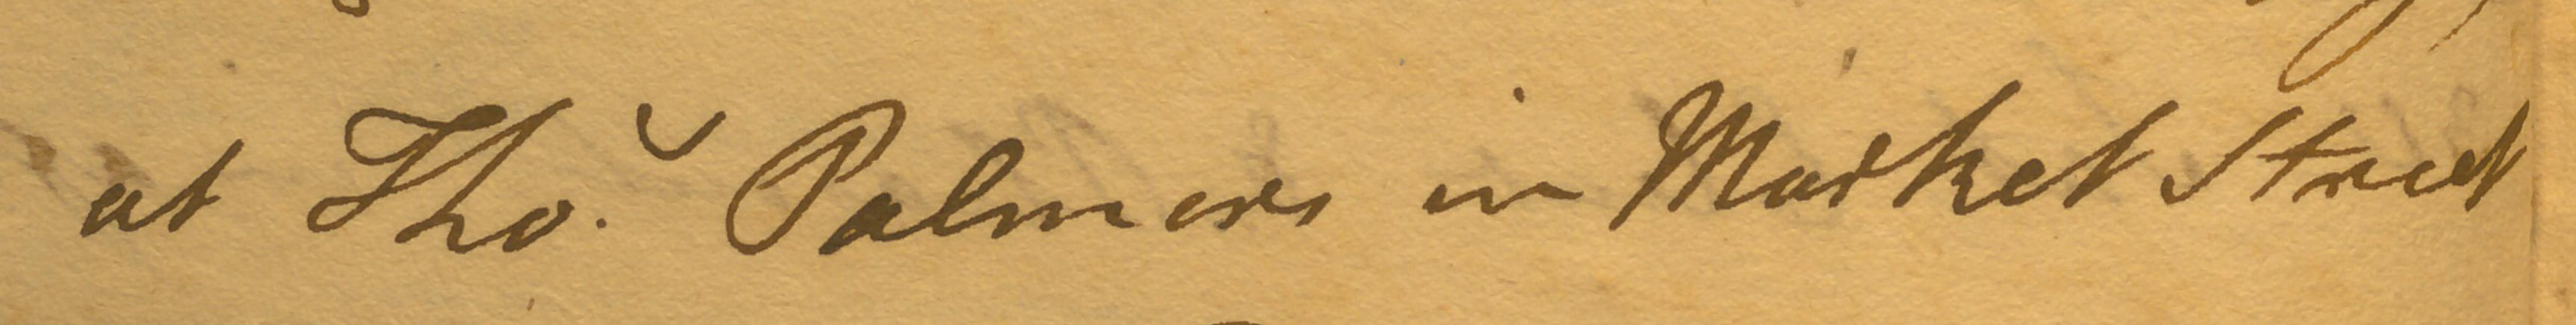at Tho^s. Palmers in Market Street
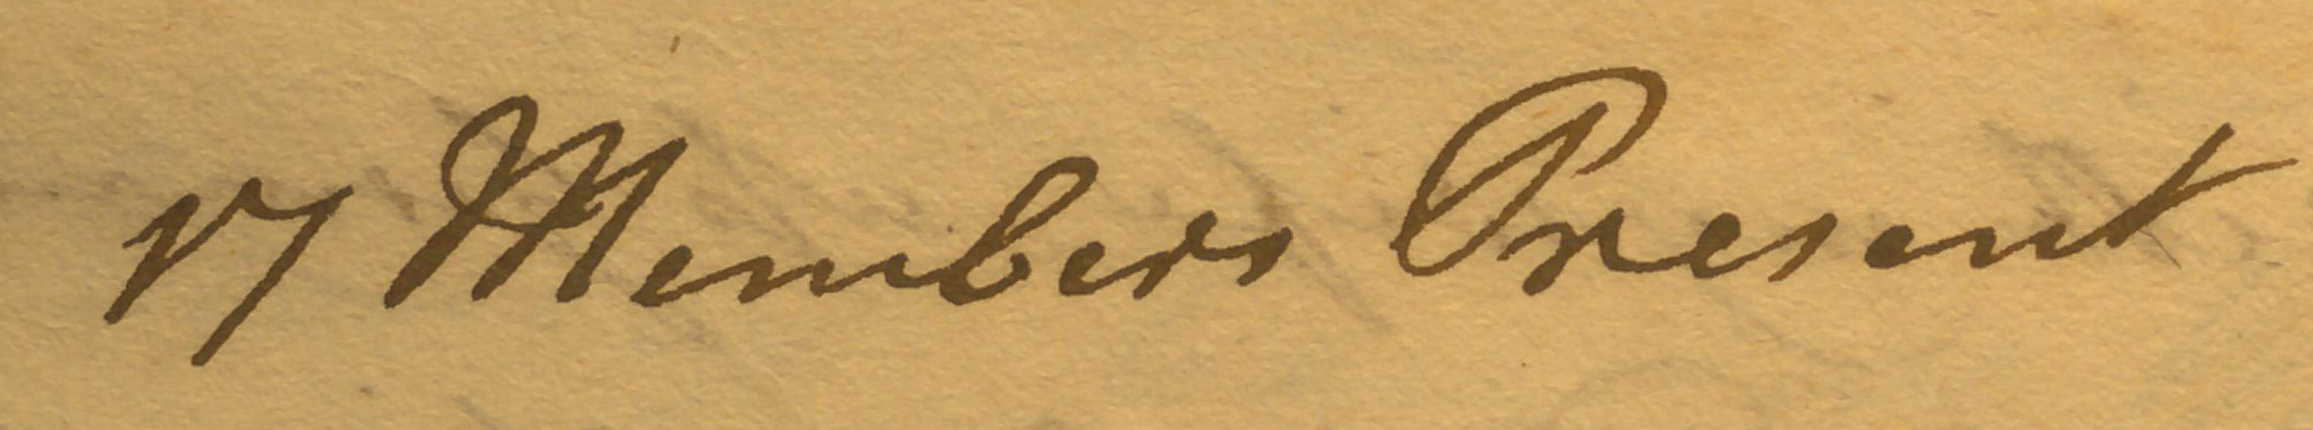17 Members Present
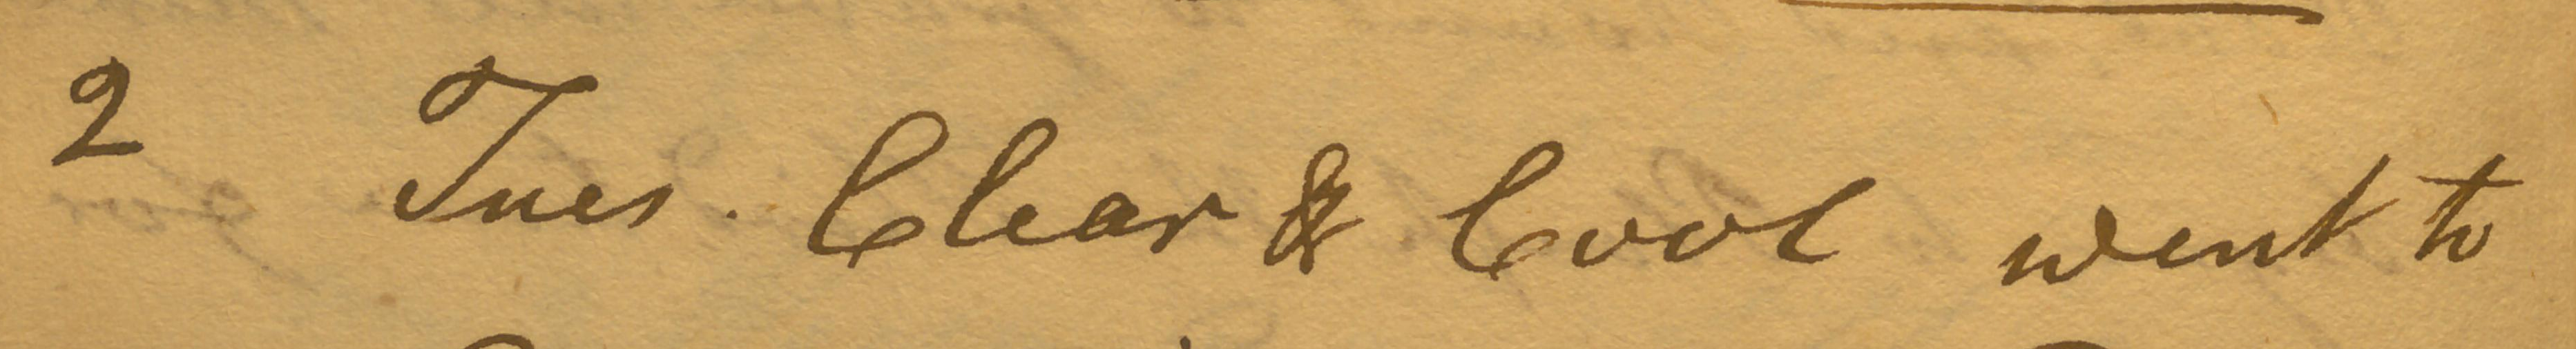2 Tues. Clear & Cool went to
